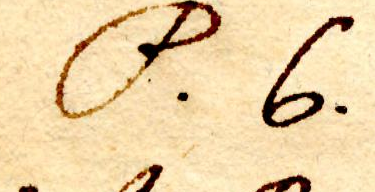P. S
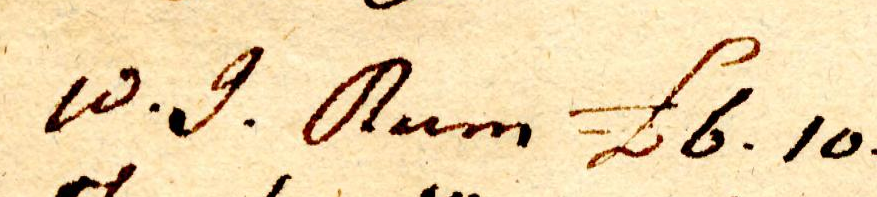W. J. Rum £6. 10.
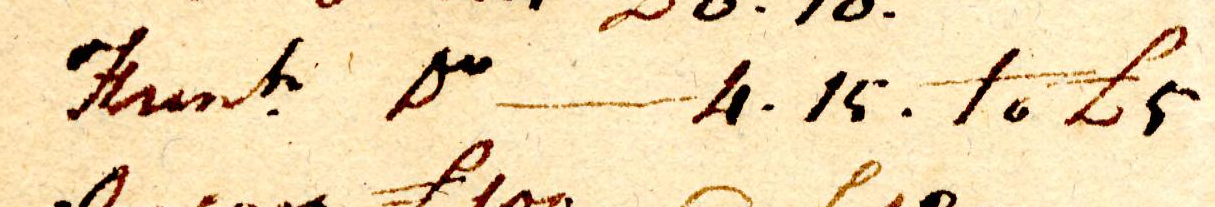Fren^h. D^o .-4.15. to £5
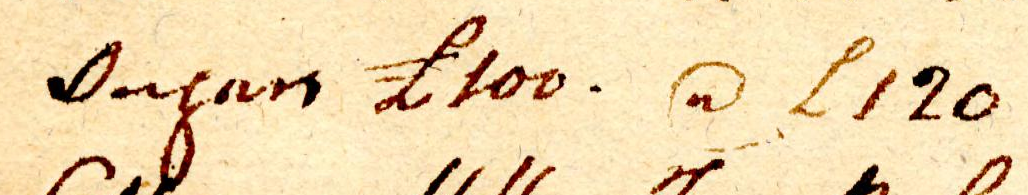Sugars £100: @ £120
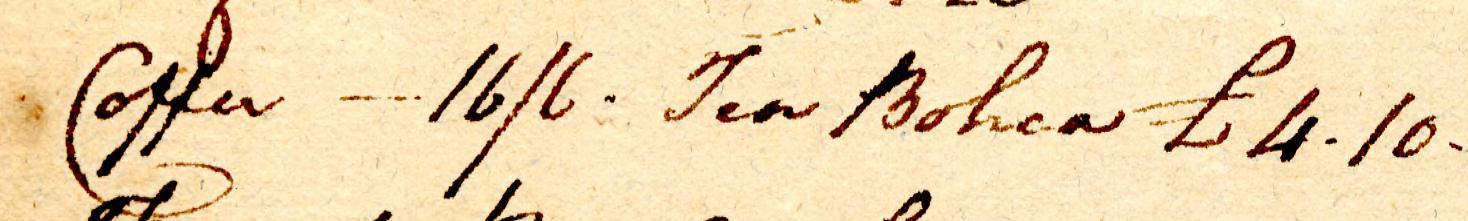Coffee.- 16s6. Tea Bohea £4. 10
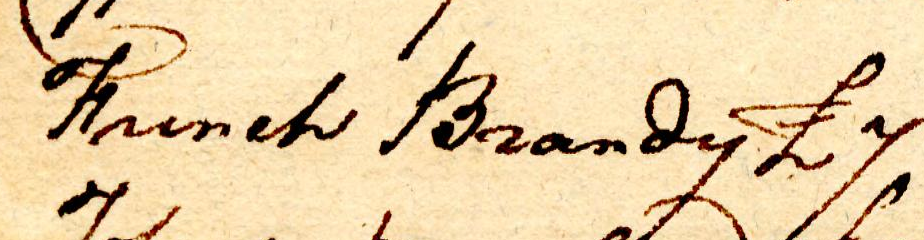French Brandy £7
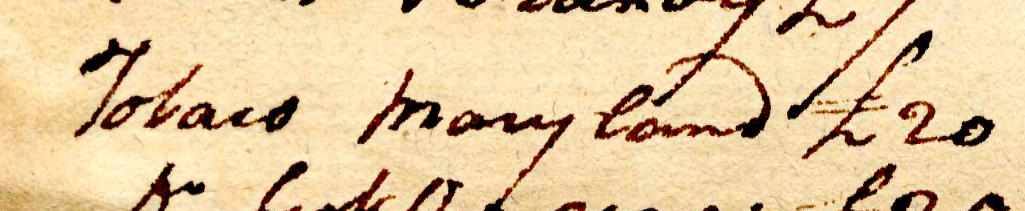Tobaco maryland £20
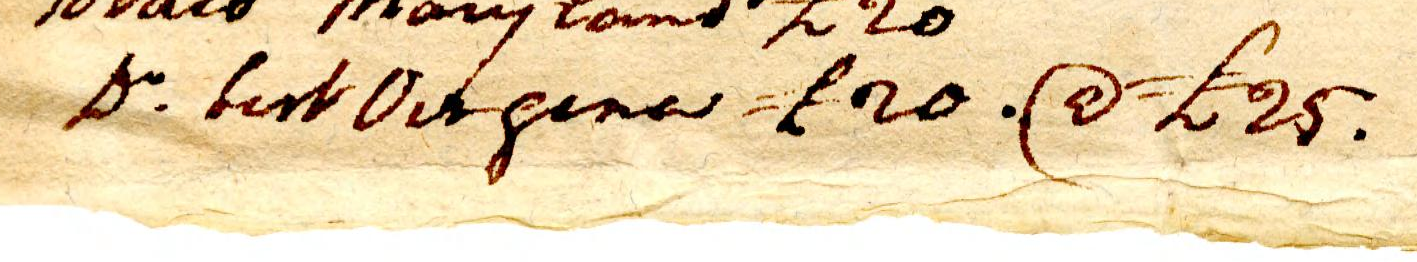D^o. best Virgina £20 @ £25
